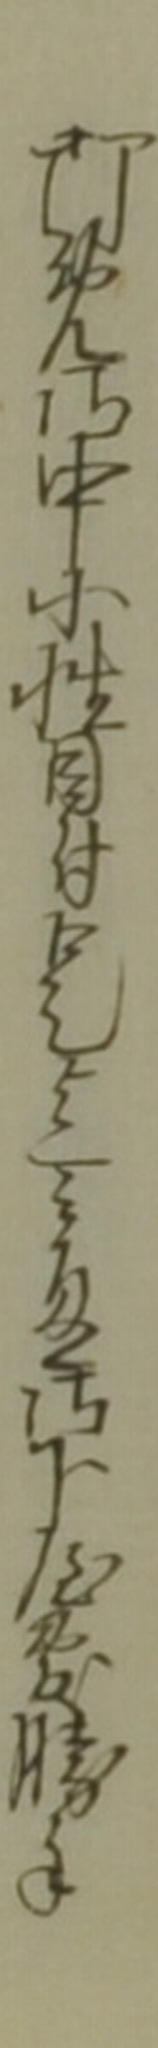御免御中小性目付是迄之通御下屋敷勝手
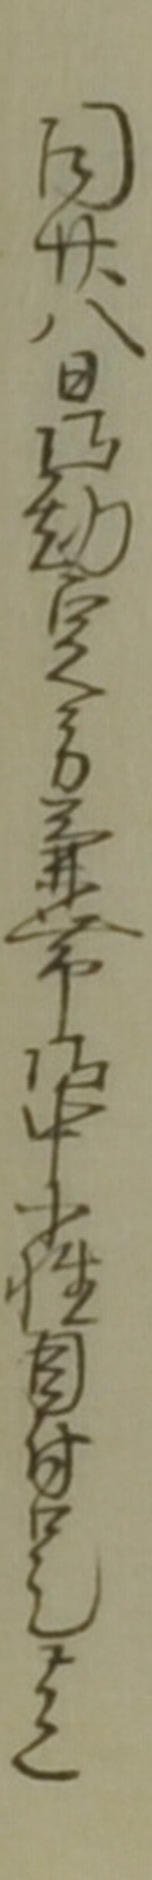同廿八日御勘定方兼帯御中小性目付是迄
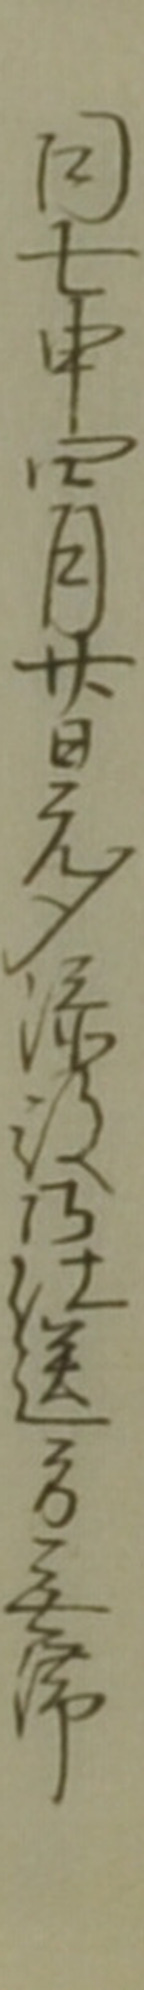一同七申四月廿日元〆添役御仕送方無滞

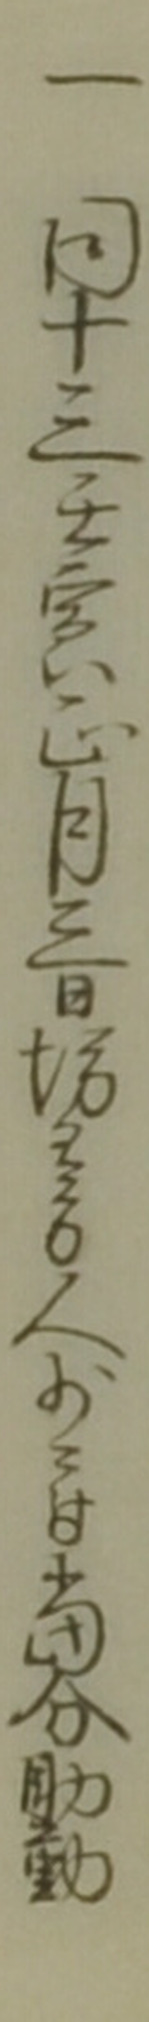一同十三壬寅正月三日坊主方人少ニ付当分助勤
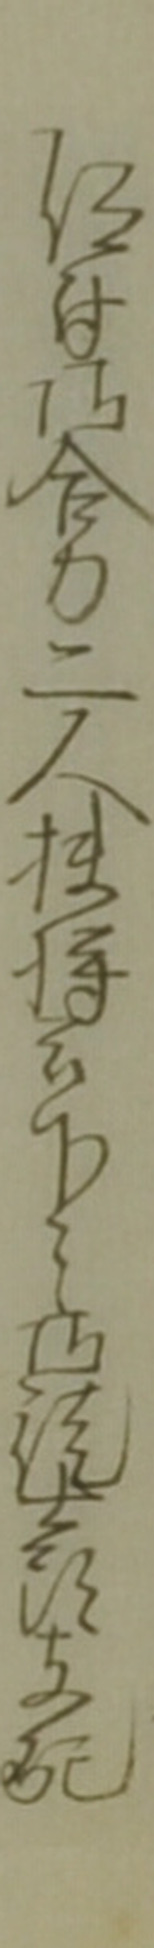仰付御合力二人扶持被下之御徒士頭支配
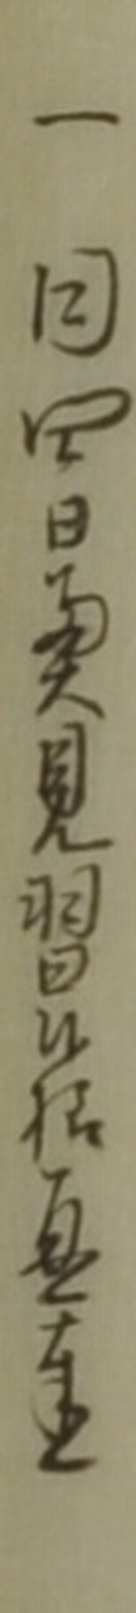一同四日奥見習候様通達
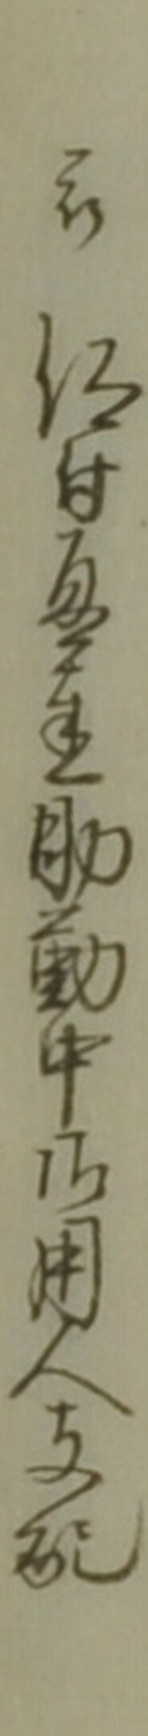被仰付通達助勤中御用人支配
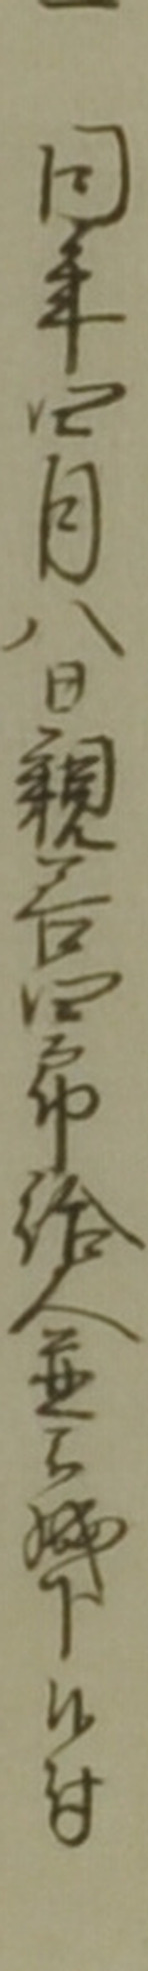一同年四月八日親善四郎給人並被成下候付
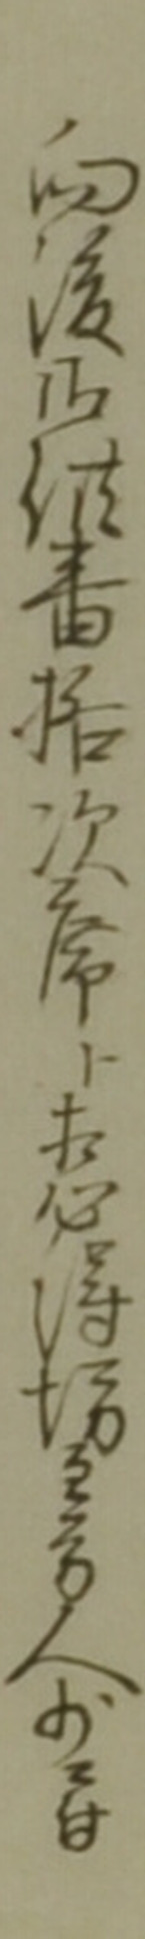向後御供番格次席相心得坊主方人少ニ付
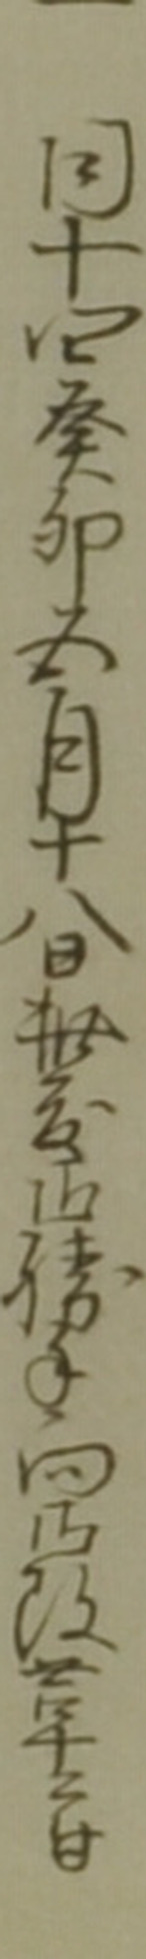一同十四癸卯五月十八日此度御勝手向御改革ニ付
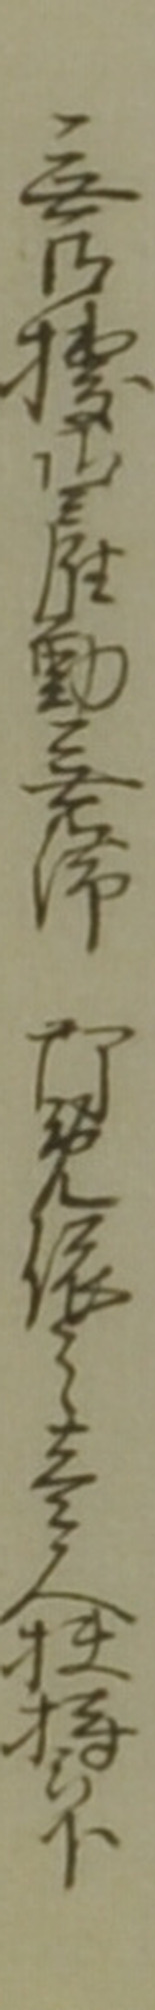無御拠御雇勤無滞御免依之壱人扶持被下
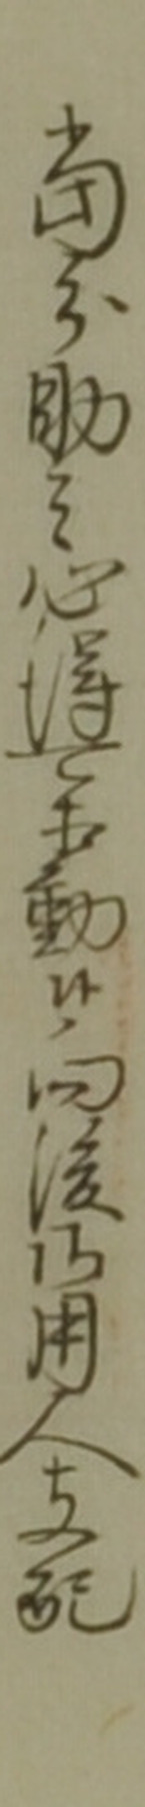当分助之心得可相勤候向後御用人支配
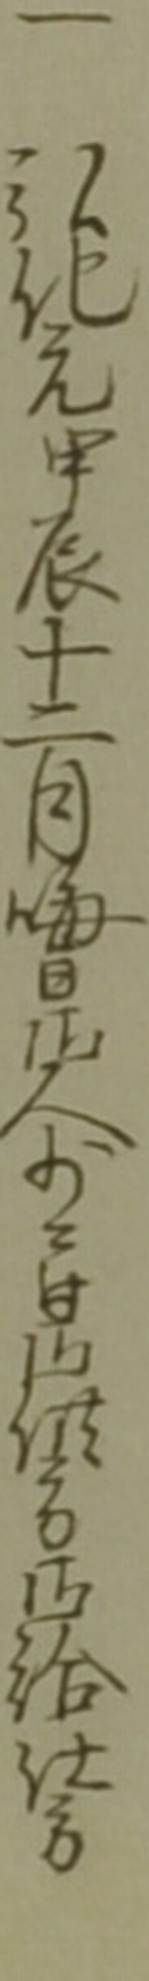一弘化元甲辰十二月晦日御人少ニ付御供方御給仕方
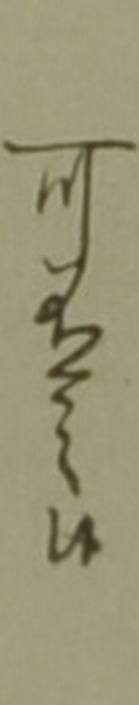可有之候
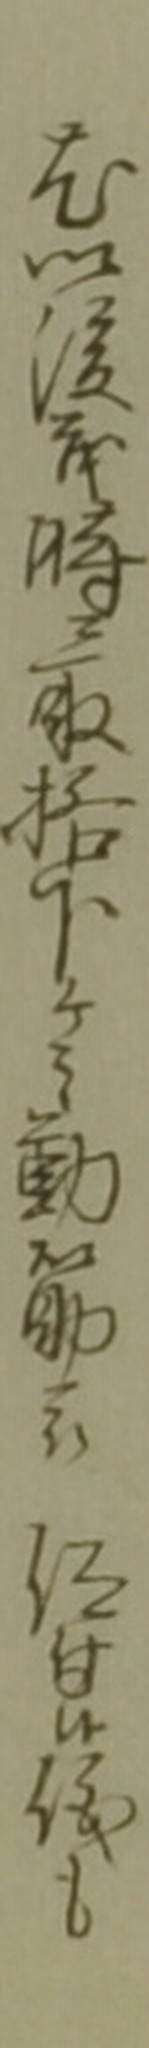尤以後茂時取格下之勤筋被仰付候儀も
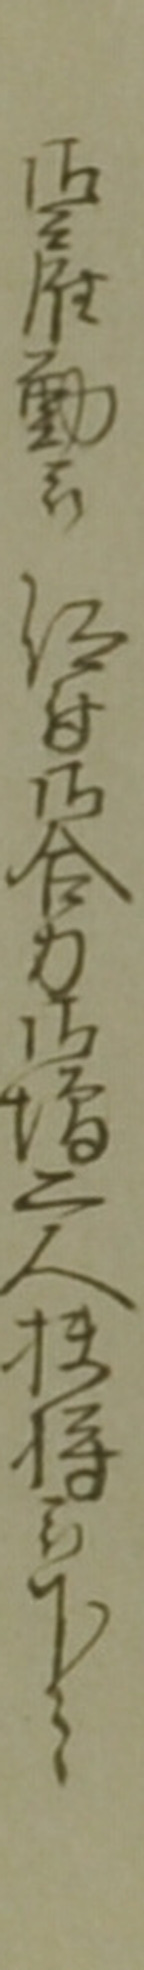御雇勤被仰付御合力増二人扶持被下之
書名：無足廃家（弐）
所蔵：伊那市立高遠町図書館・合同会社AMANE
